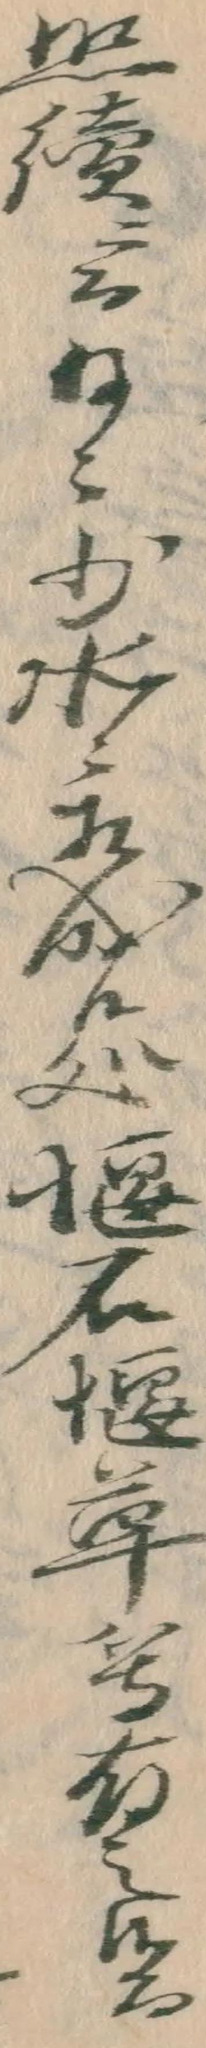照續ニ而日々少水ニ相成候処堰石堰草等有之候而
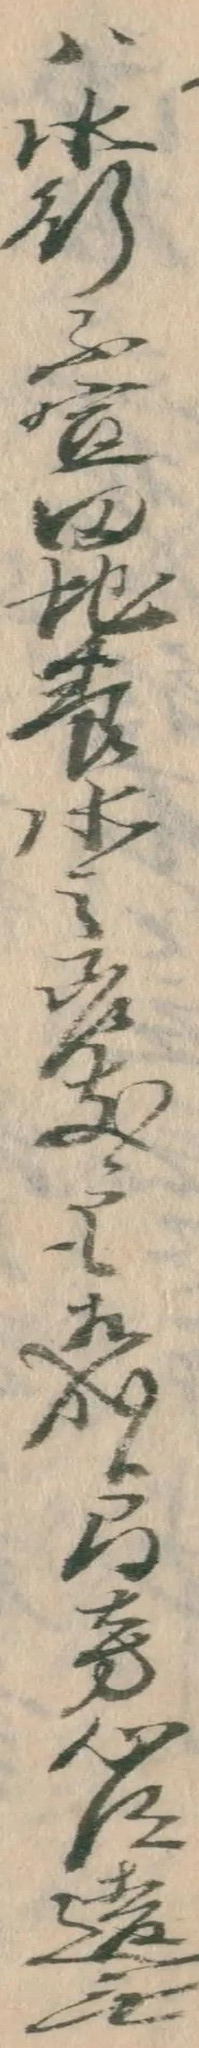ハ水行不宜田地震水之差支ニも相成候間旁心得違無
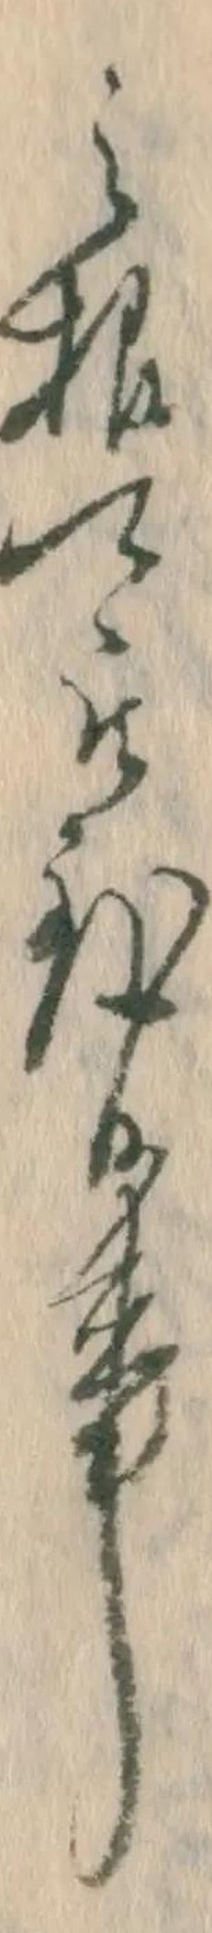之様可被致候事
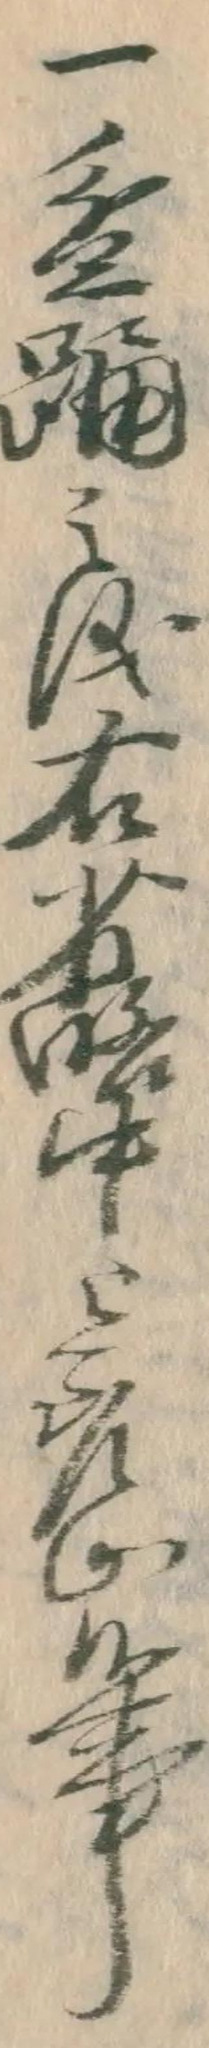一盆踊之儀右省略中被差止候事
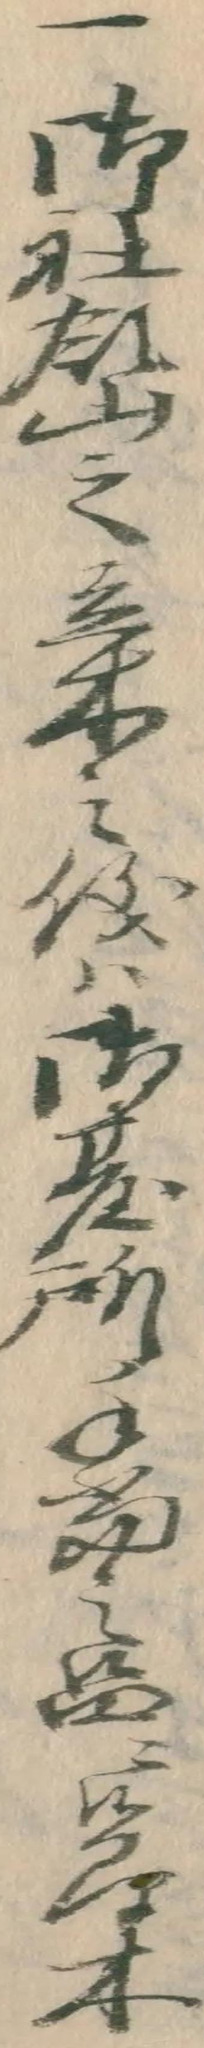一御社領山之立木之儀ハ御臺所手當之品ニ御尋木
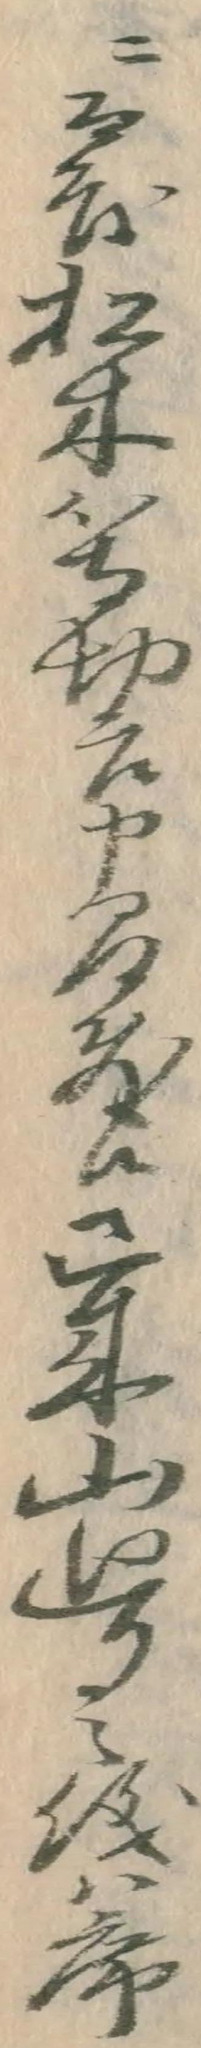ニ而も松木等切取申間敷候已来山廻り之儀ハ席

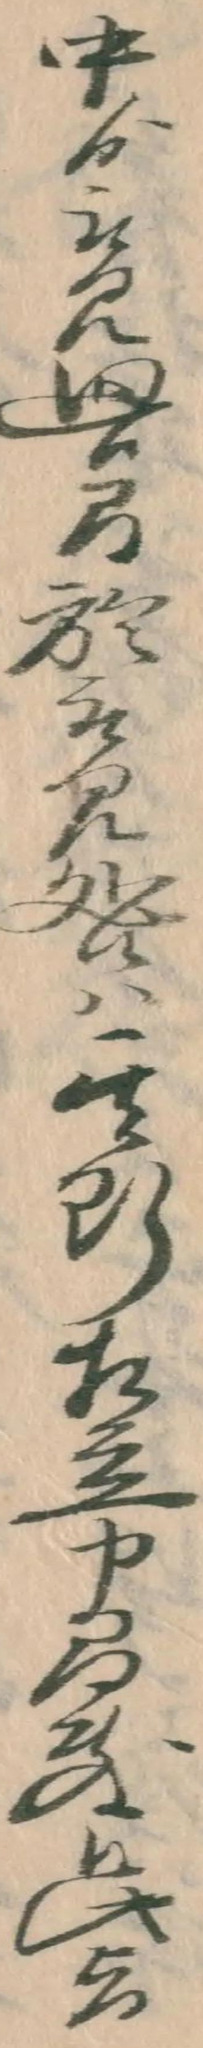中ゟ被見廻候間於取見咎ハ其断相立申間敷候此旨
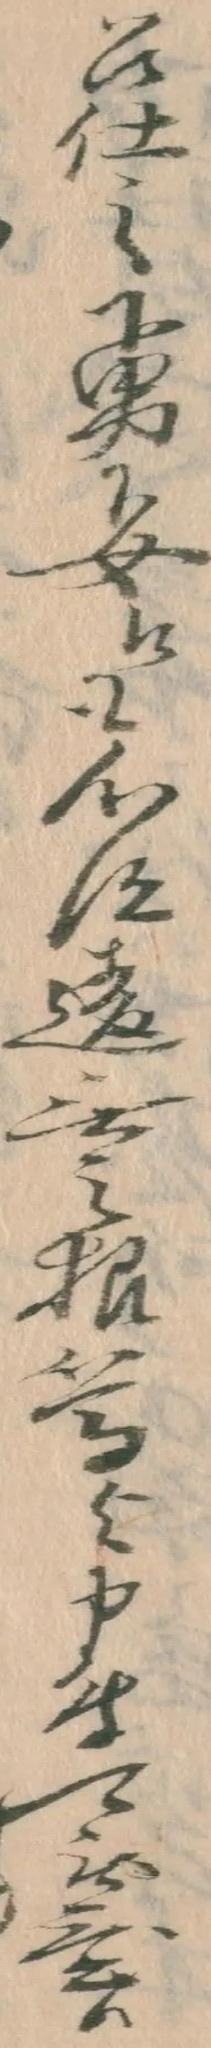召仕之下男下女にも心得違無之様篤と申付可被置候事
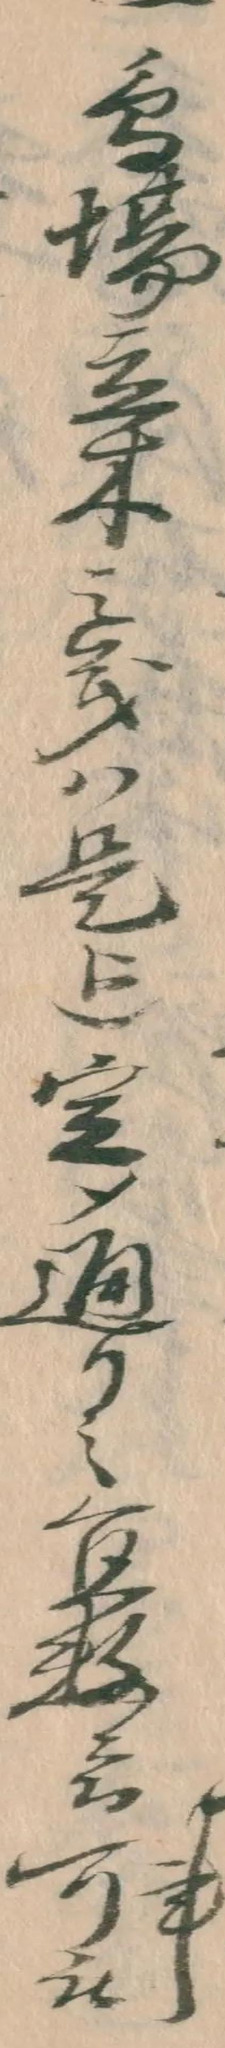一鳥場立木之義ハ是迄定メ通り之員数ニ而可取
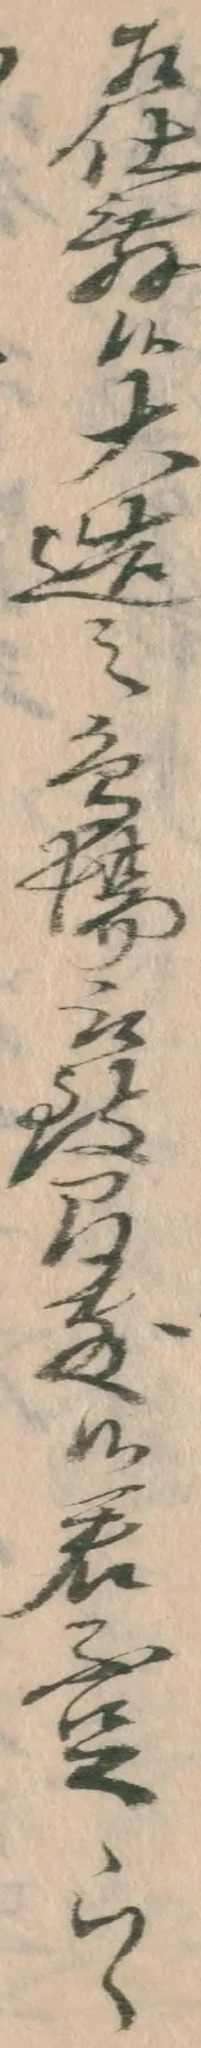相仕舞候大造之鳥揚取致間敷候若不足候ハヽ
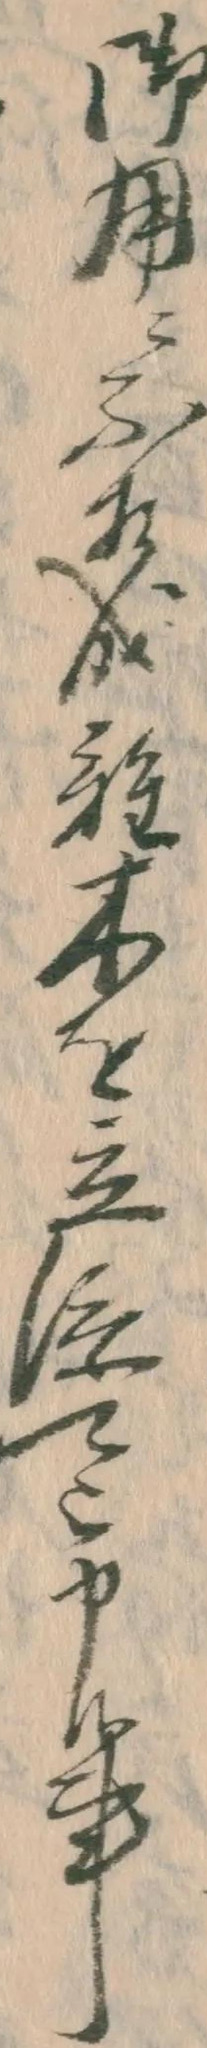御用二不相成難木を立添可被申候事
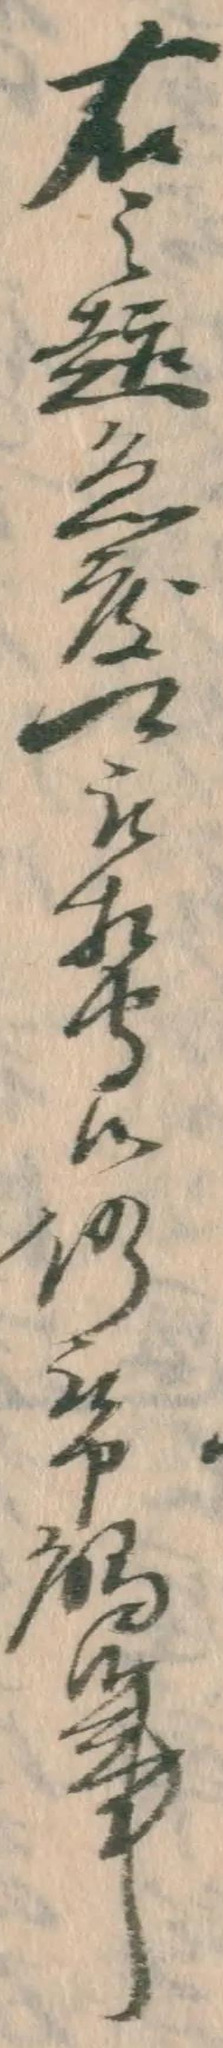右之趣急度可被相守候仍被申觸候事
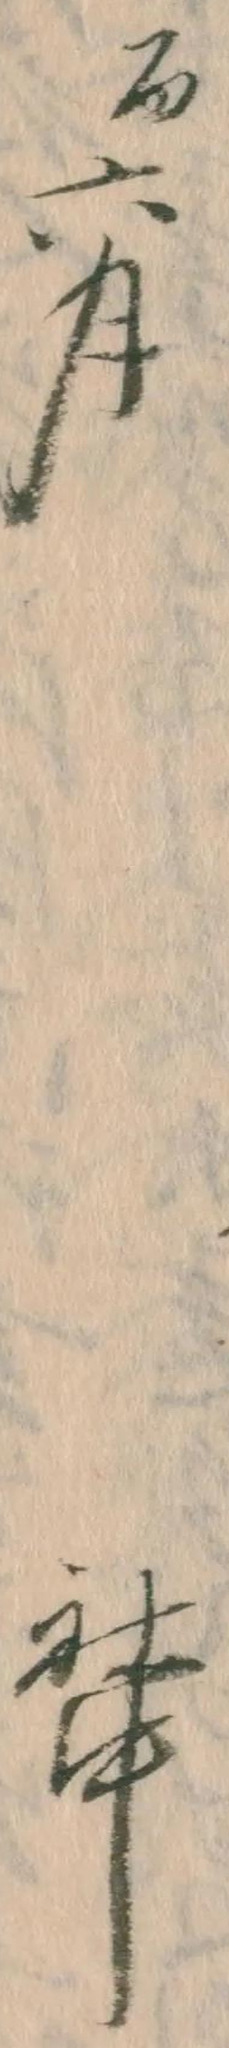酉六月社中
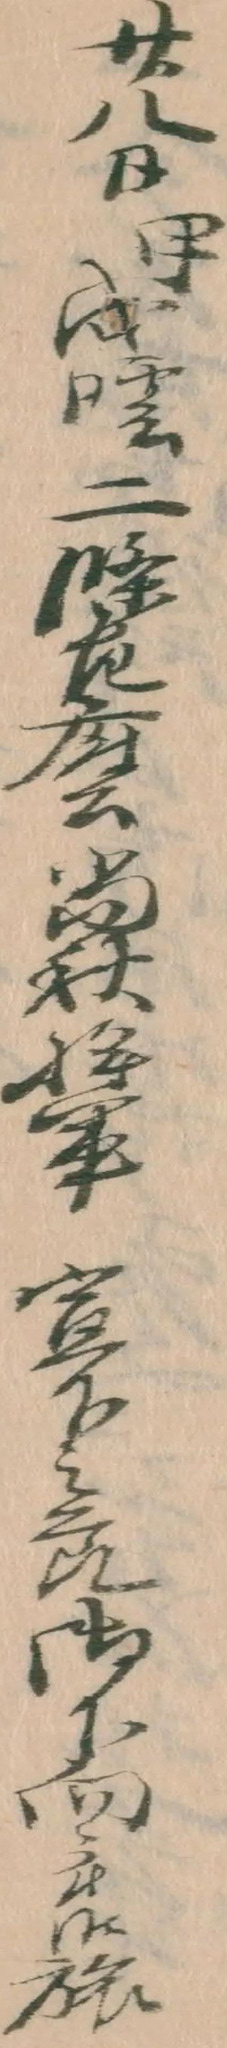廿八日甲戌曇二條左府公當秋将軍宣下之節御下向ニ付御旅
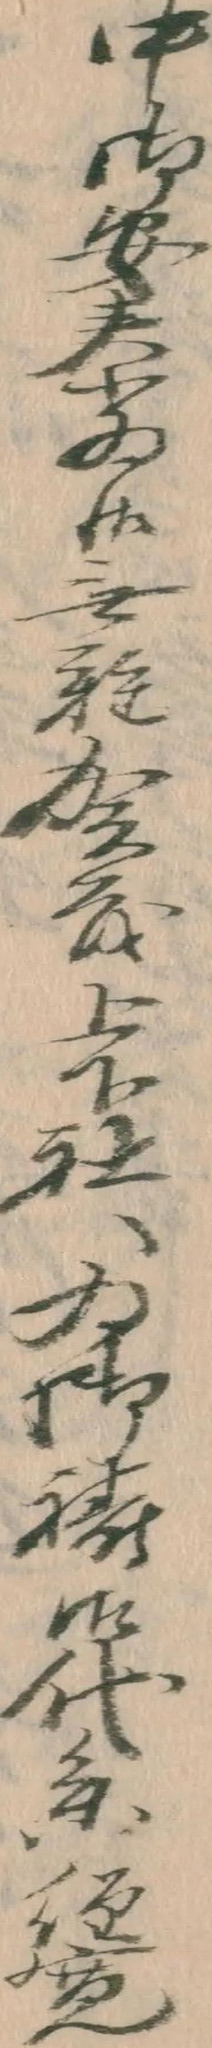中御安泰為御無難賀茂上下社へ為御祷御代参経寛
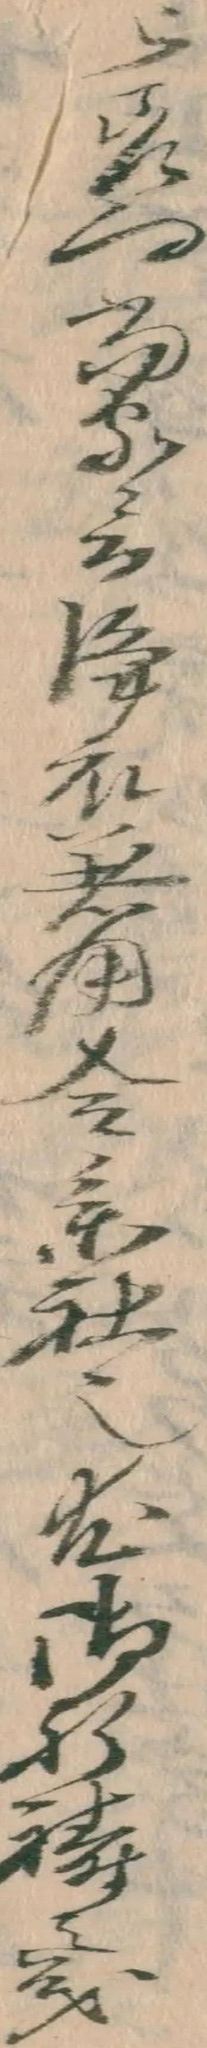被差向當家ニ而浄衣着用令参社之尤御祈祷之義
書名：賀茂社記録. 第67冊
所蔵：国立国会図書館 National Diet Library, JAPAN
